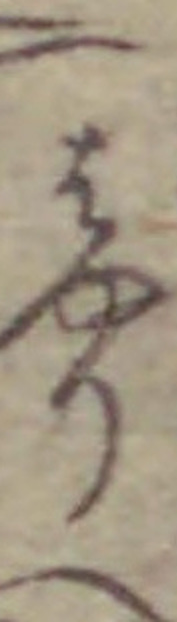はやり

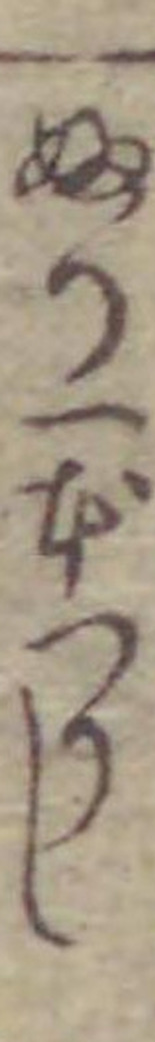ふり一本つりし
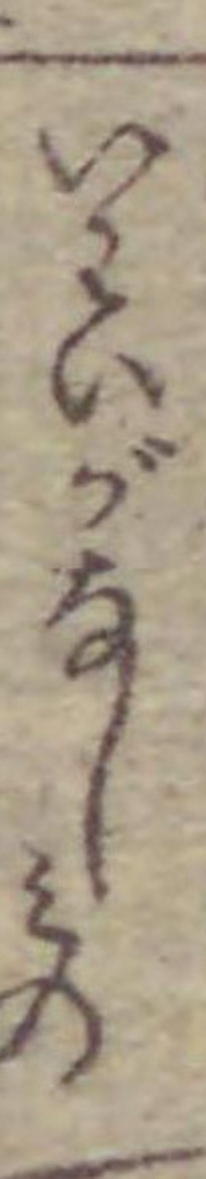いわいがなしみの
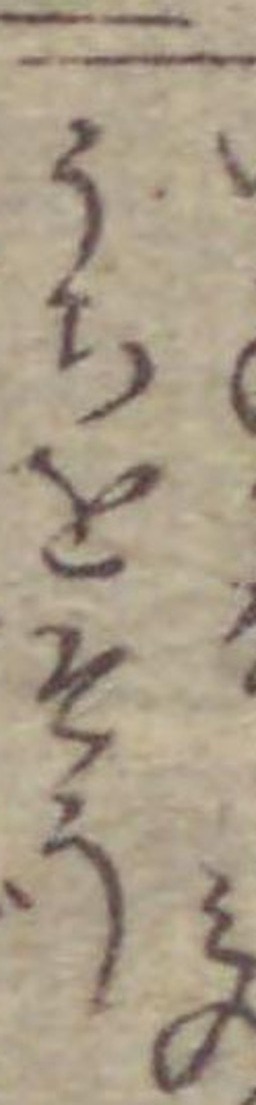うちをそう
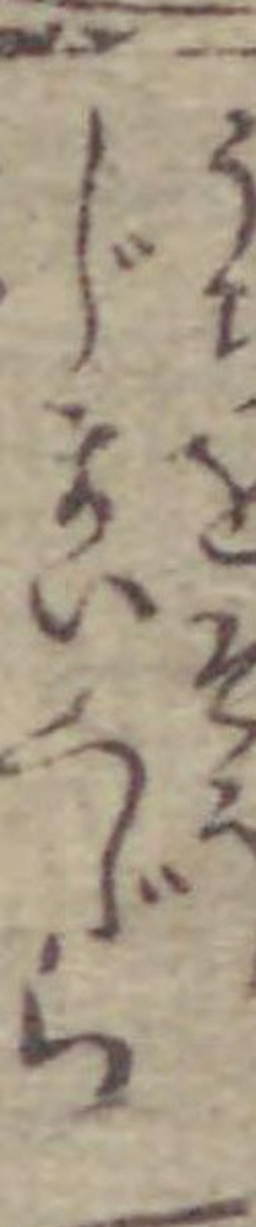じまいくじら
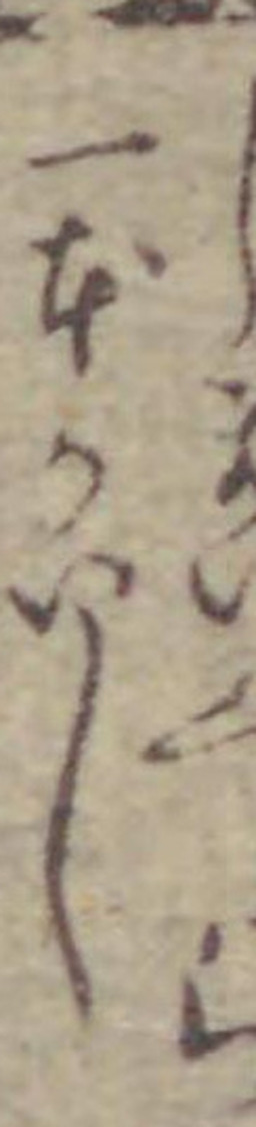一本かいし
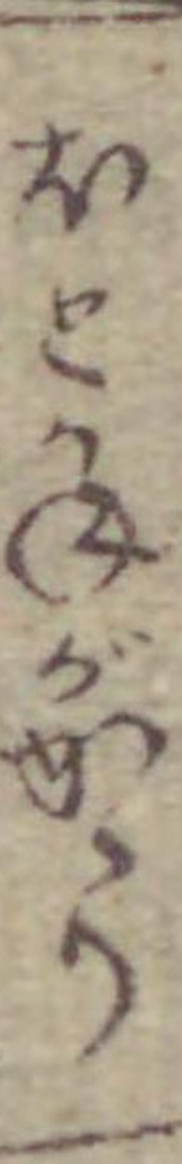ほとかねがかゝり
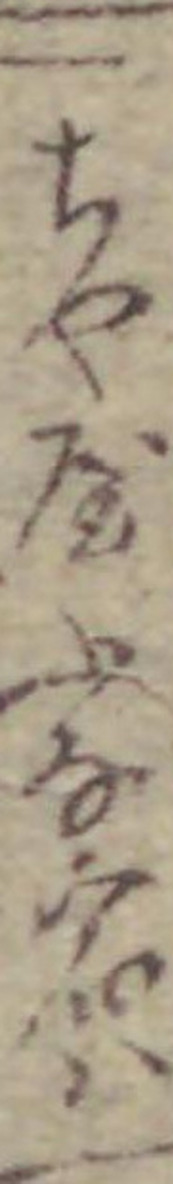ちや屋ふな宿は
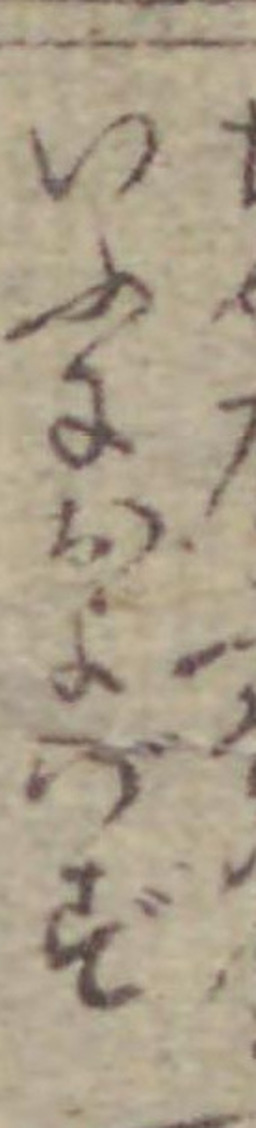いふにおよばず
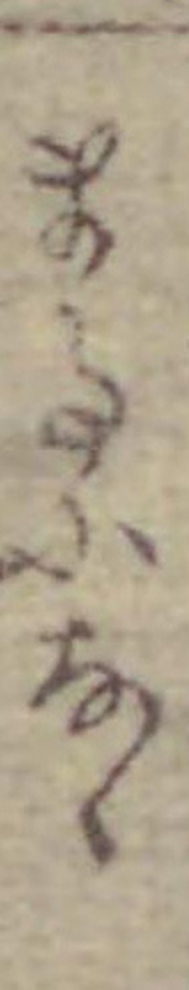ま事になゝ
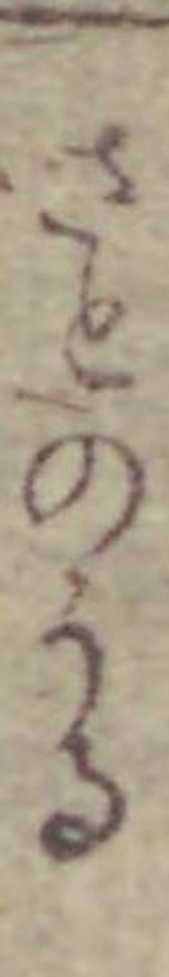さとのうる
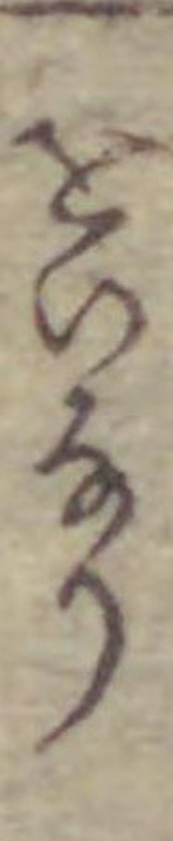をいなり
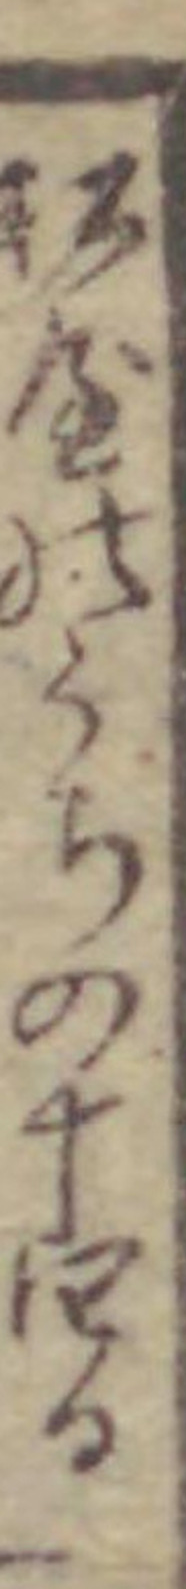松屋のうちの十四日
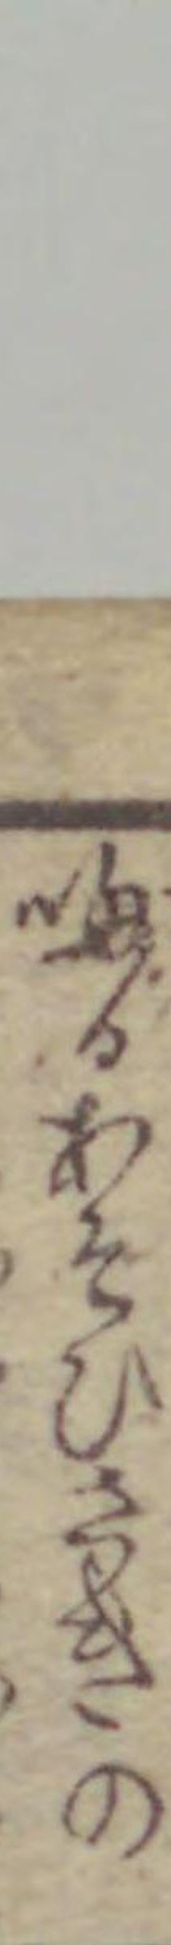晦日あそひさきの
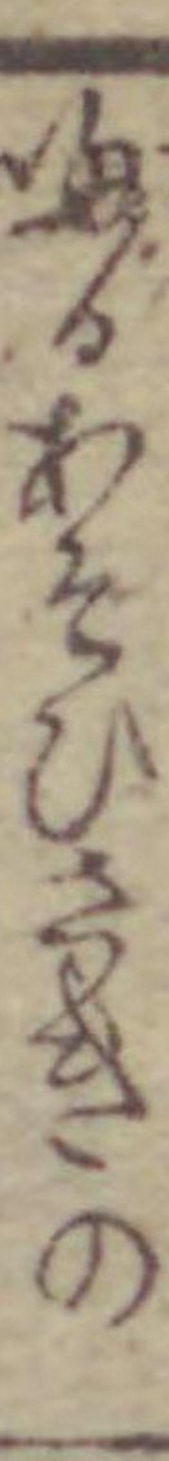晦日あそひさきの
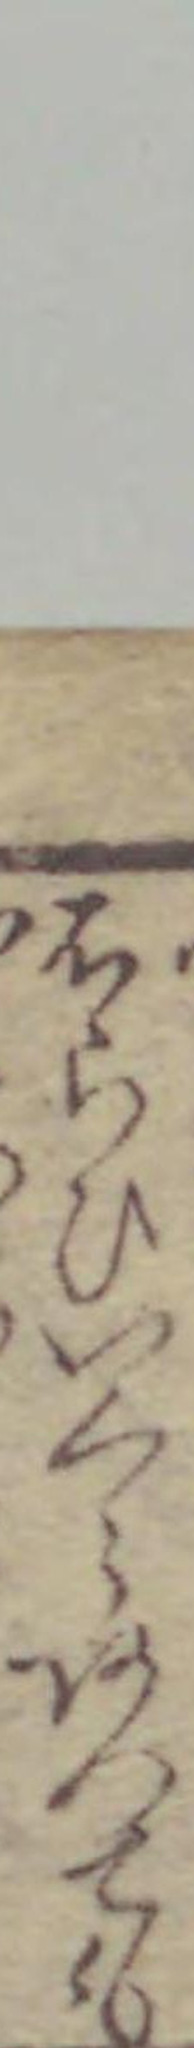はらひいくらあつても
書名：親父布子鳶握 3巻
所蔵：国立国会図書館 National Diet Library, JAPAN
